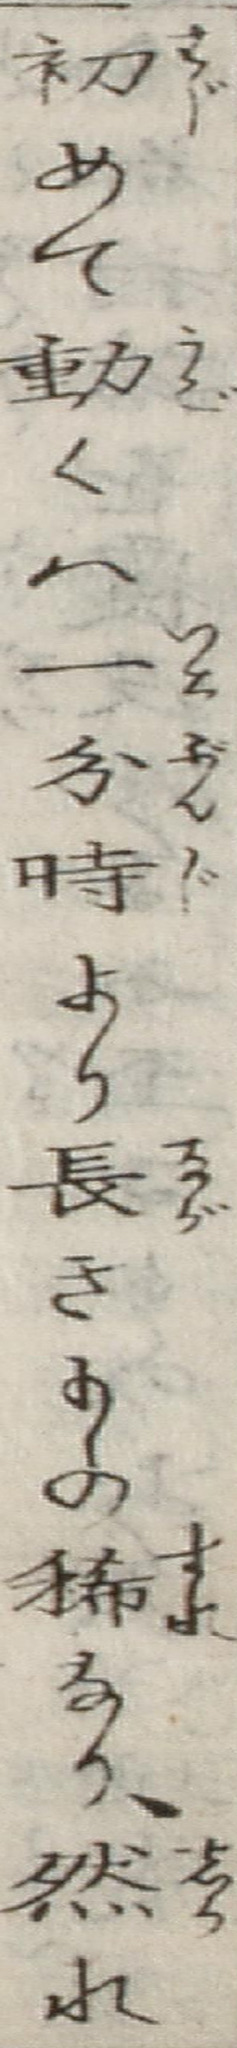初めて動くは一分時より長きもの稀なり、然れ
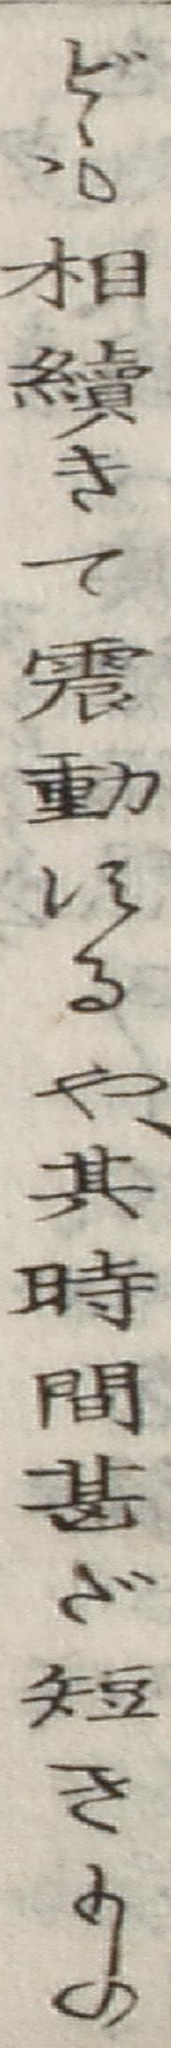ども相続きて震動するや、其時間甚だ短きもの
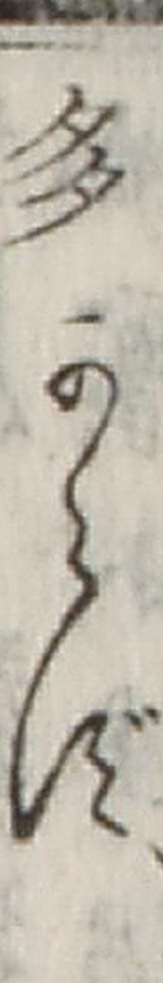多からず、
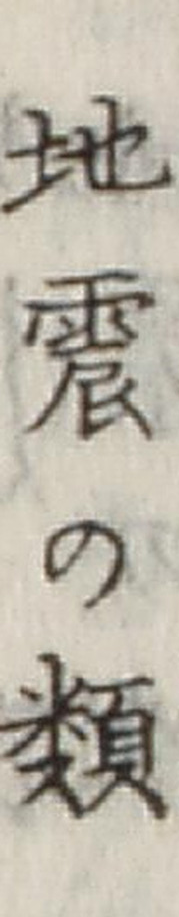地震の類
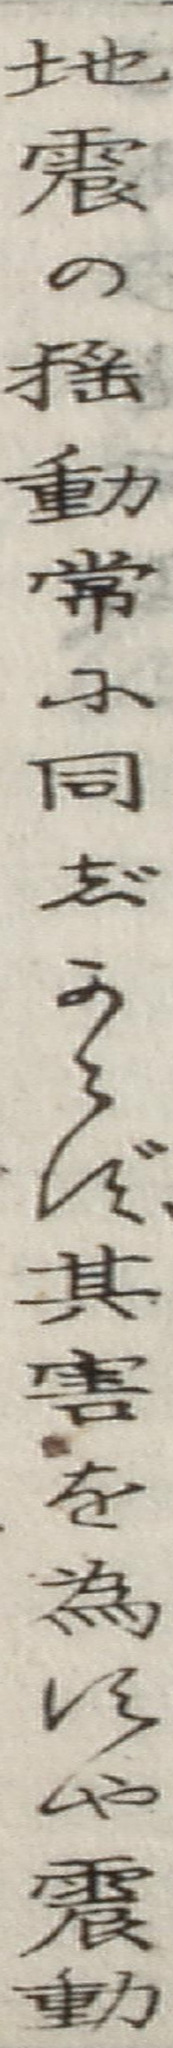地震の揺動常に同じからず、其害を為すや震動
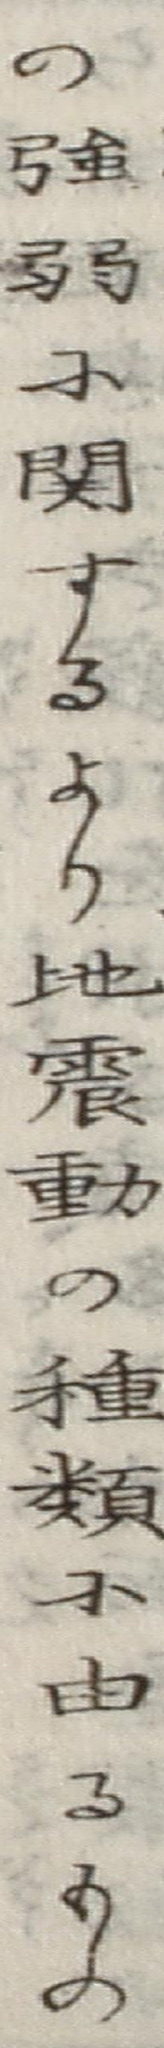の強弱に関するより地震動の種類に由るもの
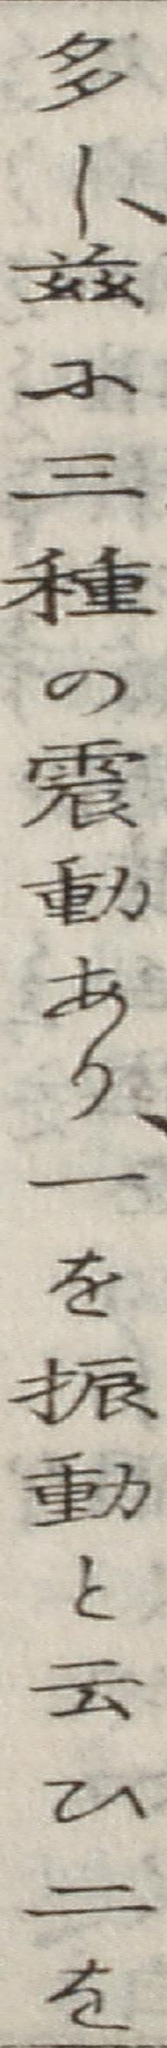多し、茲に三種の震動あり、一を振動と云ひ、二を
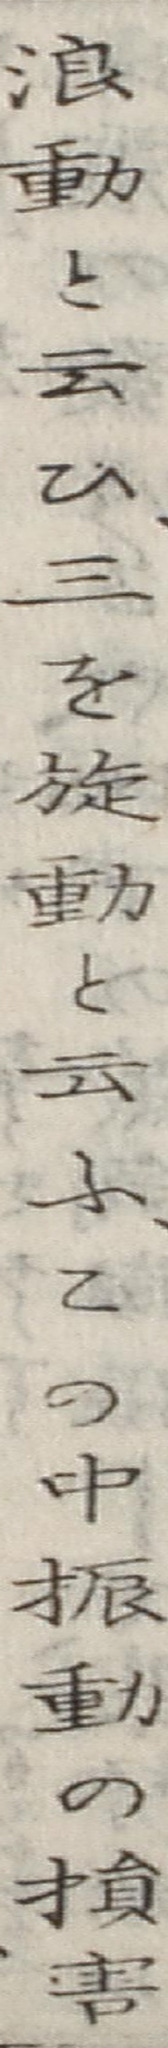浪動と云ひ、三を旋動と云ふ、この中振動の損害
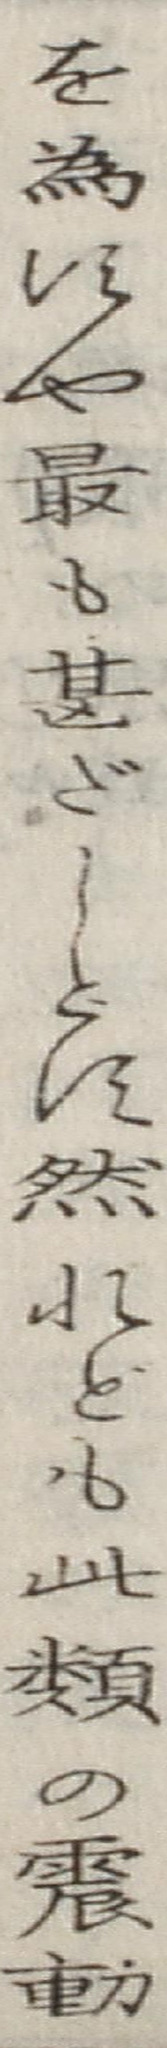を為すや最も甚だしとす、然れども此類の震動
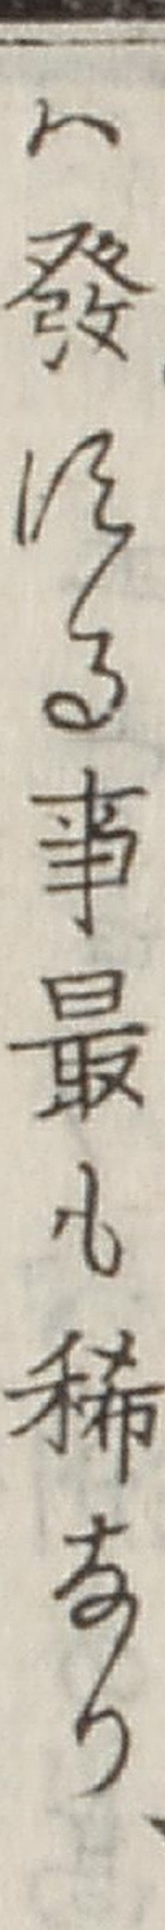は発する事最も稀なり、
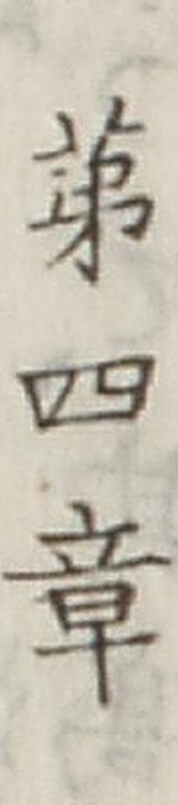第四章
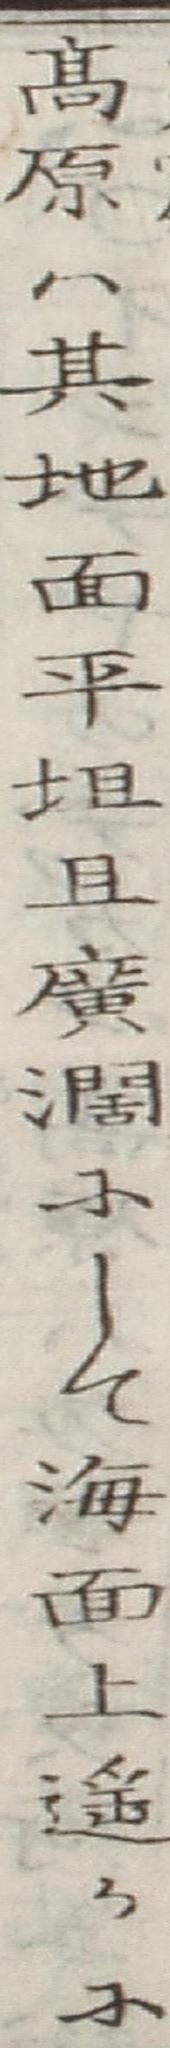高原は其地面平坦且廣闊にして海面上遥かに
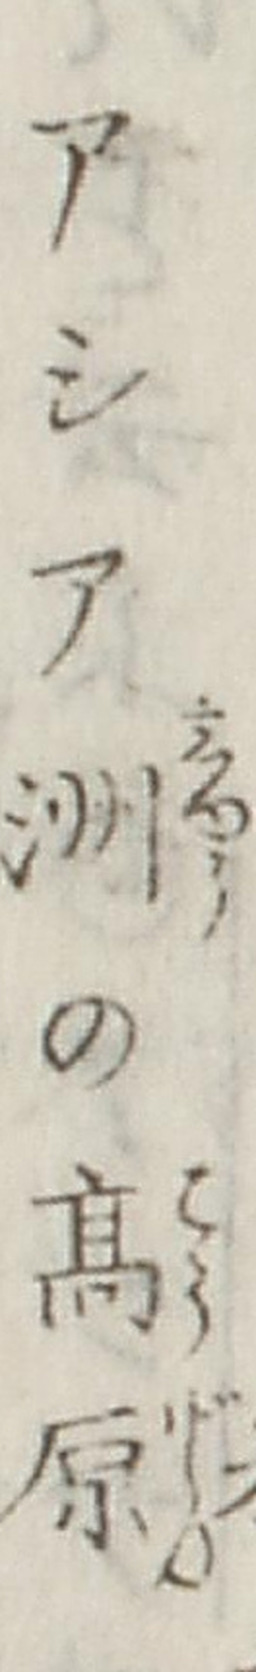アシア洲の高原
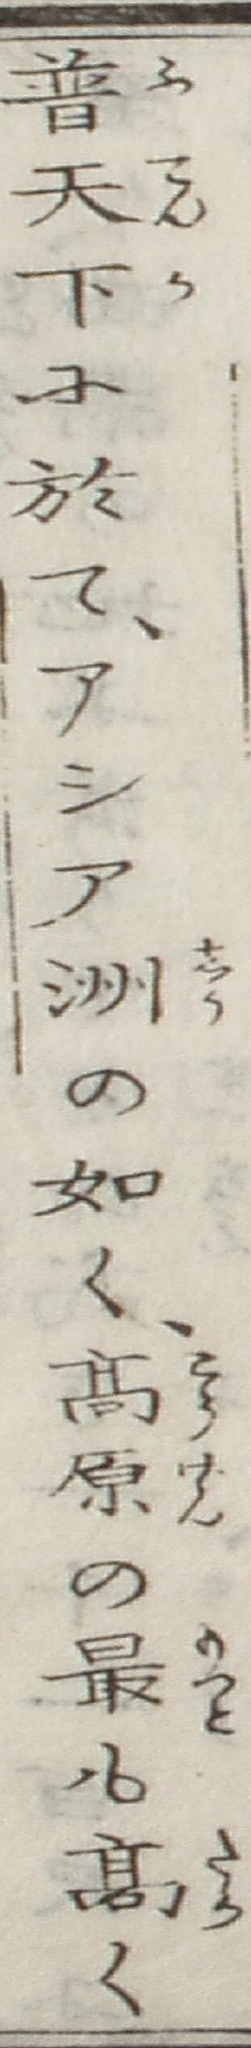普天下に於て、アシア洲の如く、高原の最も高く
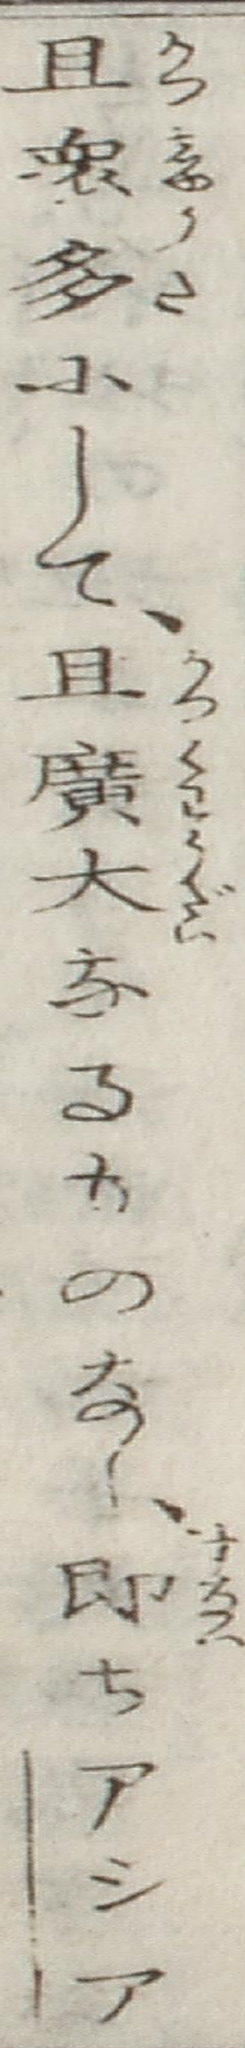且衆多にして、且広大なるものなし、即ちアシア
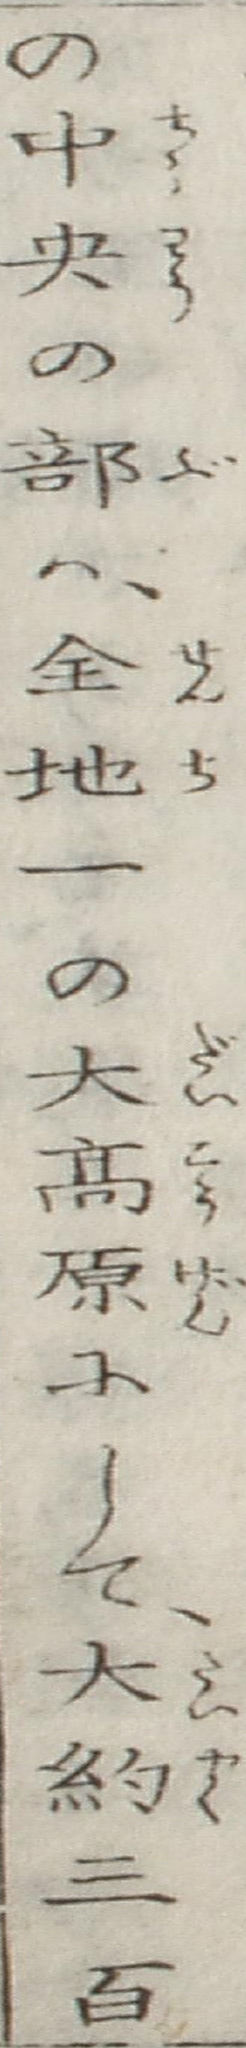の中央の部は、全地一の大高原にして、大約三百
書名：訓蒙　天然地理學　上
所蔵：東京大学地震研究所図書室 Earthquake Research Institute Library, The University of Tokyo, JAPAN
